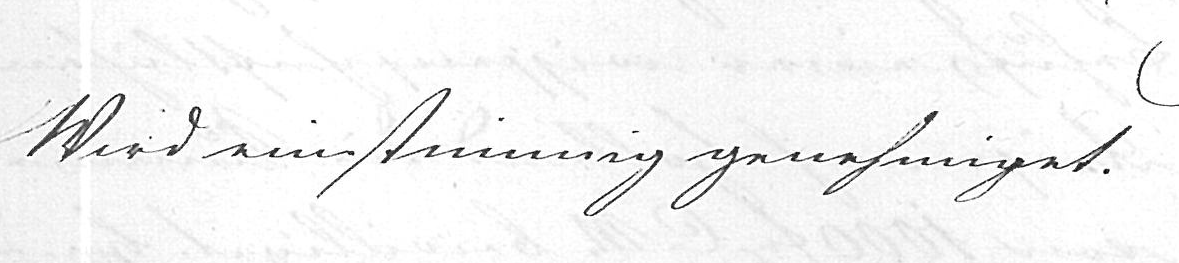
Wird einstimmig genehmiget.
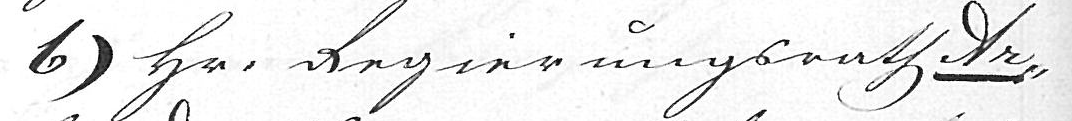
b) Hr. Regierungsrath Ar-
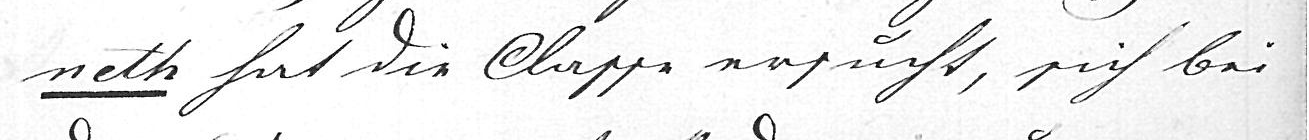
neth hat die Classe ersucht, sich bei
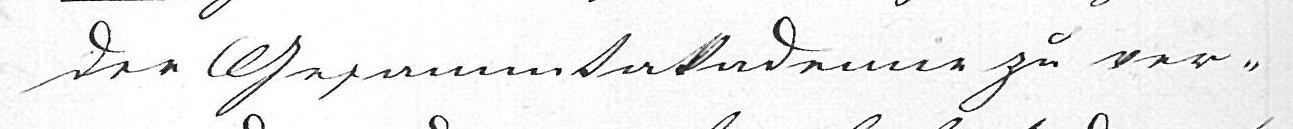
der Gesammtakademie zu ver-
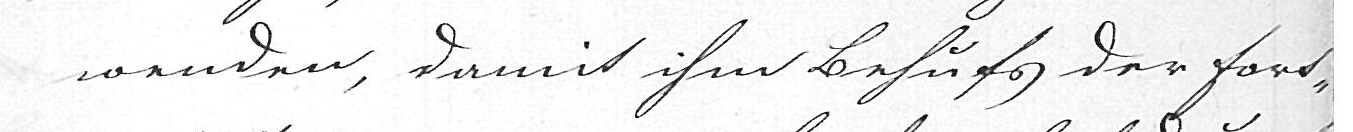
wenden, damit ihm Behufs der fort-
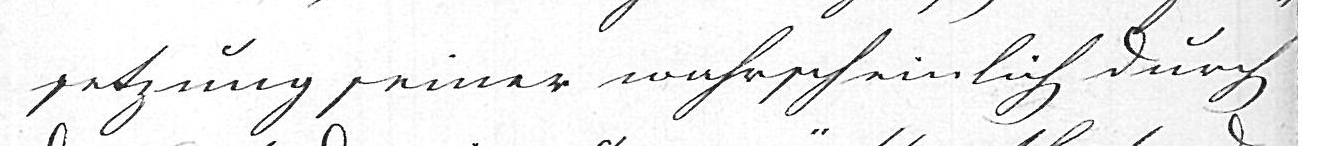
setzung seiner wahrscheinlich durch
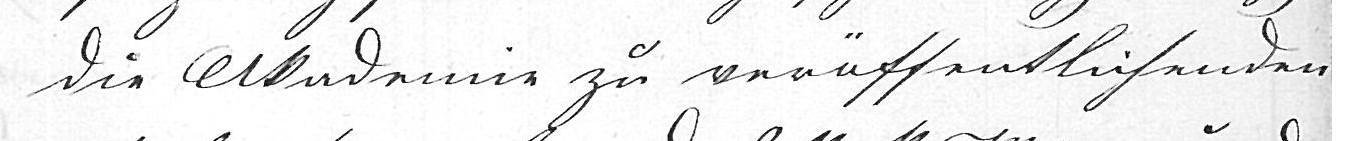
die Akademie zu veröffentlichenden
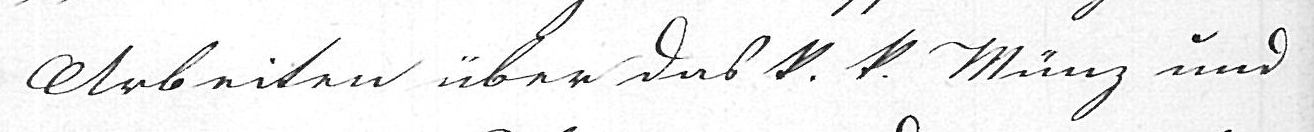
Arbeiten über das. k.k. Münz und
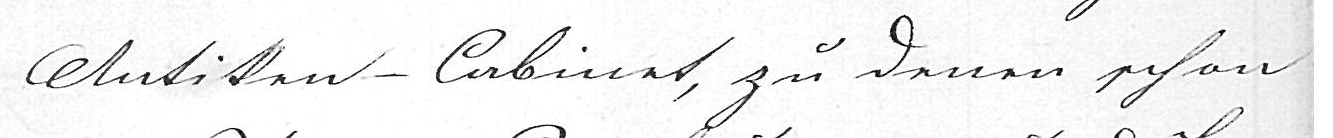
Antiken-Cabiet, zu denen schon
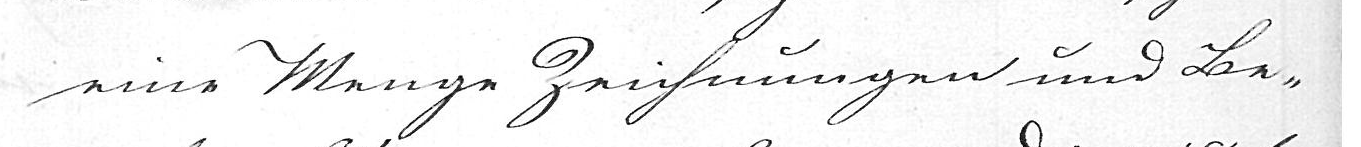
eine Menge Zeichnungen und Be-
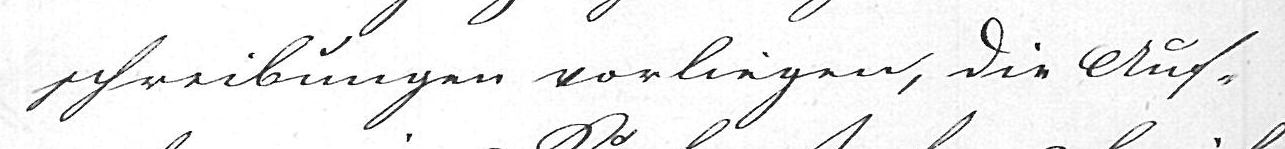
schreibungen vorliegen, die Auf-
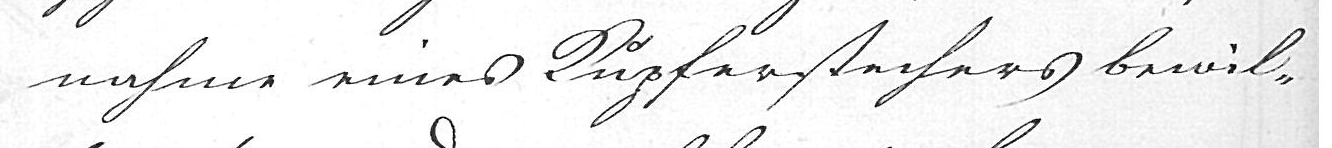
nahme eines Kupferstechers bewil-
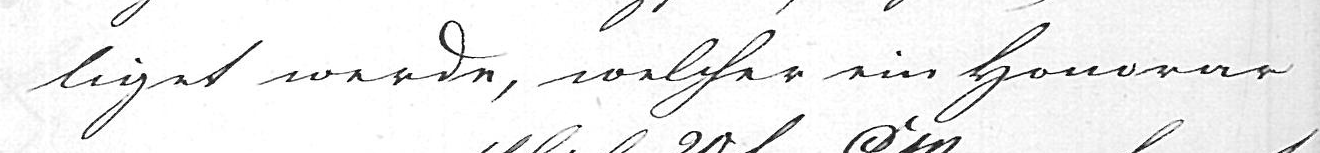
liget werde, welcher ein Honorar
